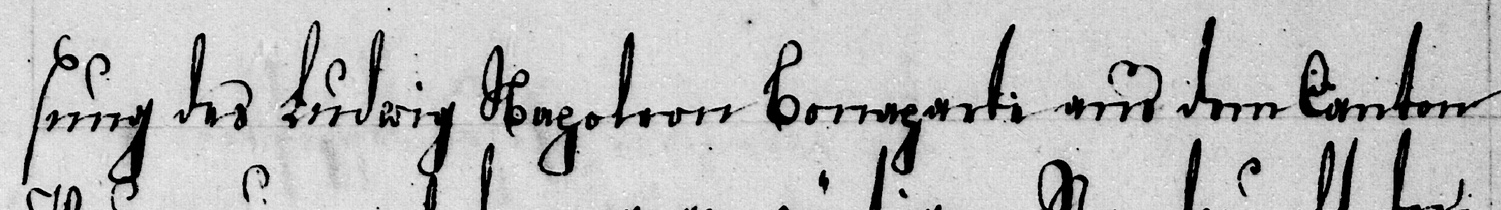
sung des Ludwig Napoleon Bonaparte aus dem Canton
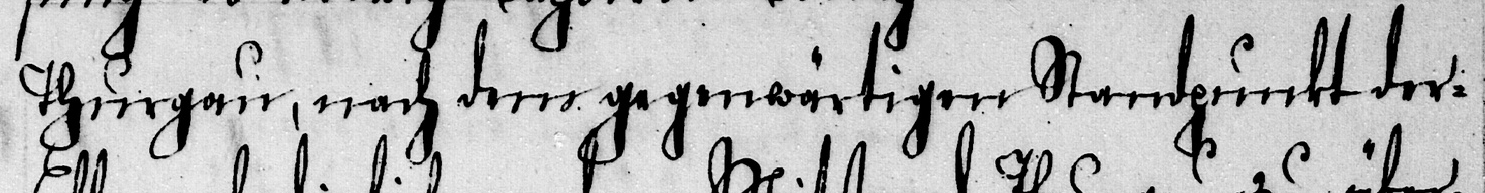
Thurgau, nach dem gegenwärtigen Standpunkt der¬
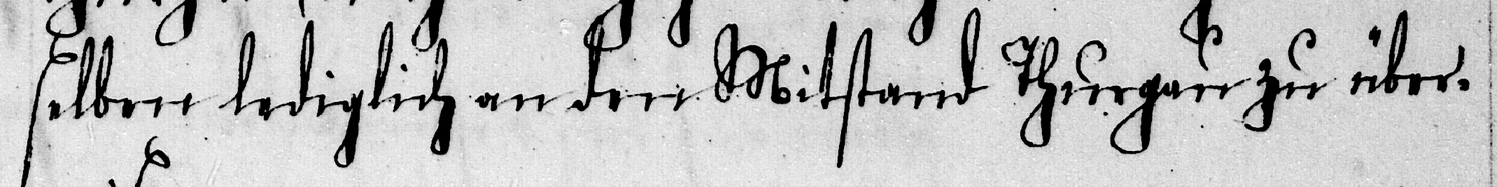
selben lediglich an den Mitstand Thurgau zu über¬
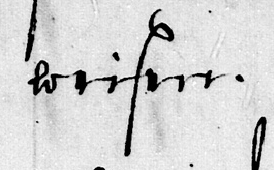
weisen.
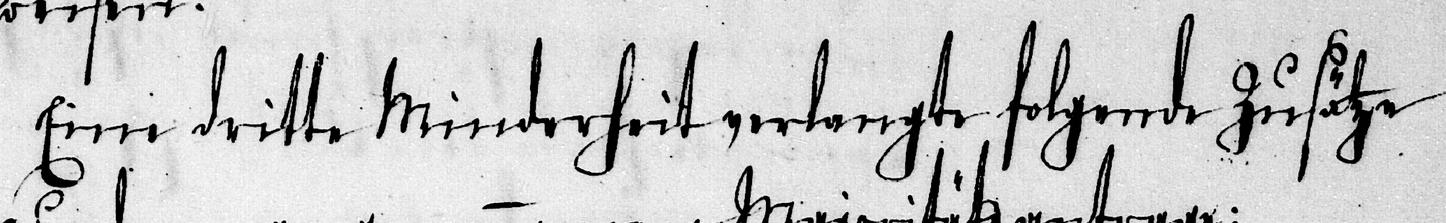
Eine dritte Minderheit verlangte folgende Zusätze
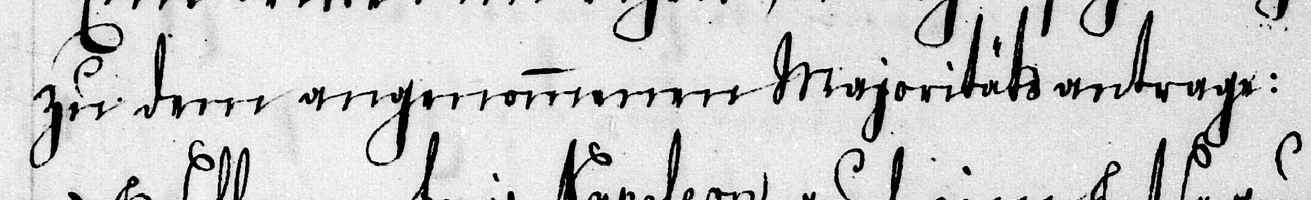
zu dem angenommenen Majoritätsantrage:
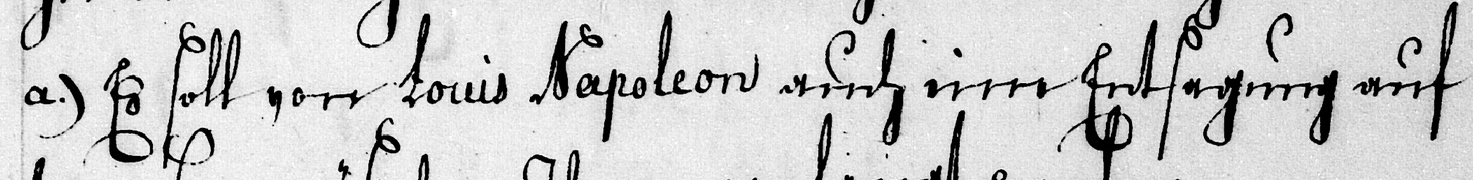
a.) Es soll von Louis Napoleon auch eine Entsagung auf
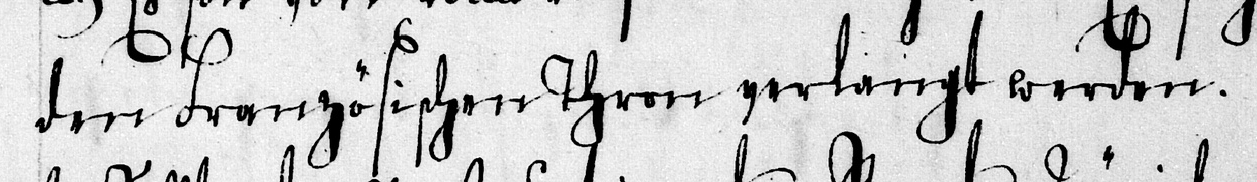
den Französischen Thron verlangt werden.
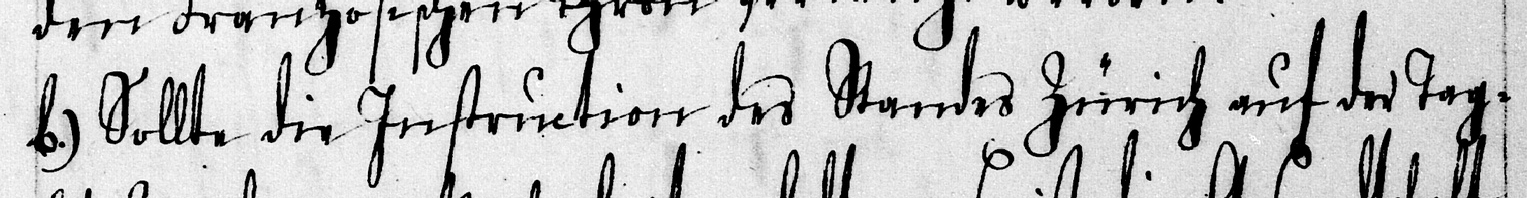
b.) Sollte die Instruction des Standes Zürich auf der Tag¬
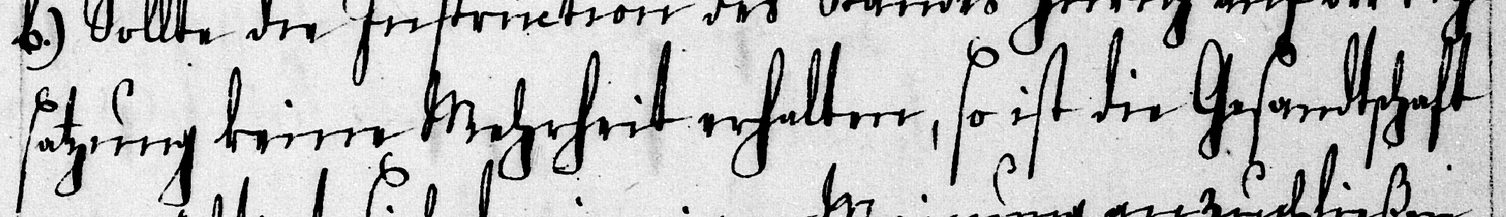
satzung keine Mehrheit erhalten, so ist die Gesandtschaft
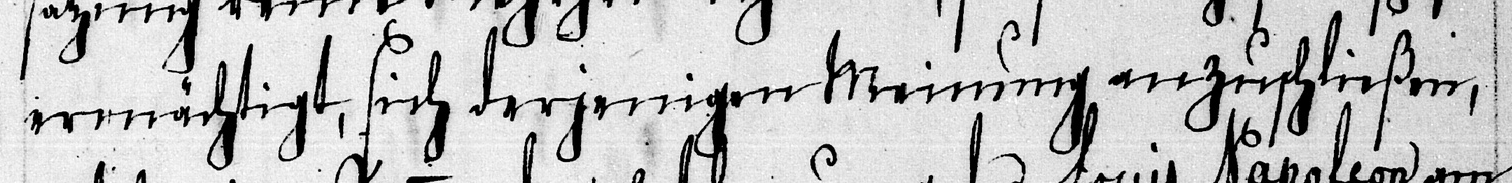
ermächtigt, sich derjenigen Meinung anzuschließen,
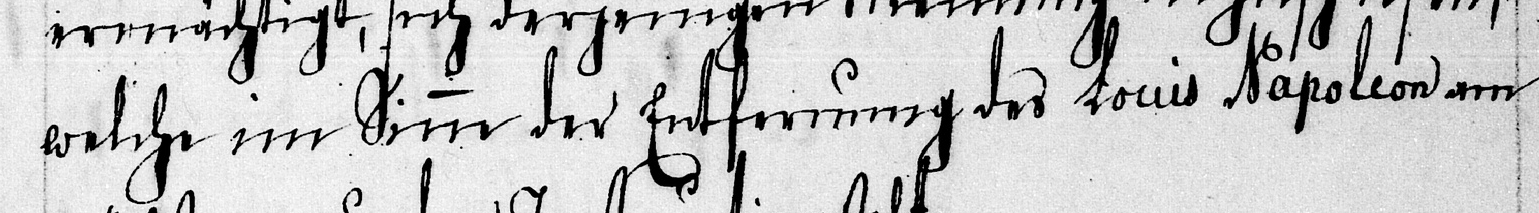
welche im Sinne der Entfernung des Louis Napoleon am
